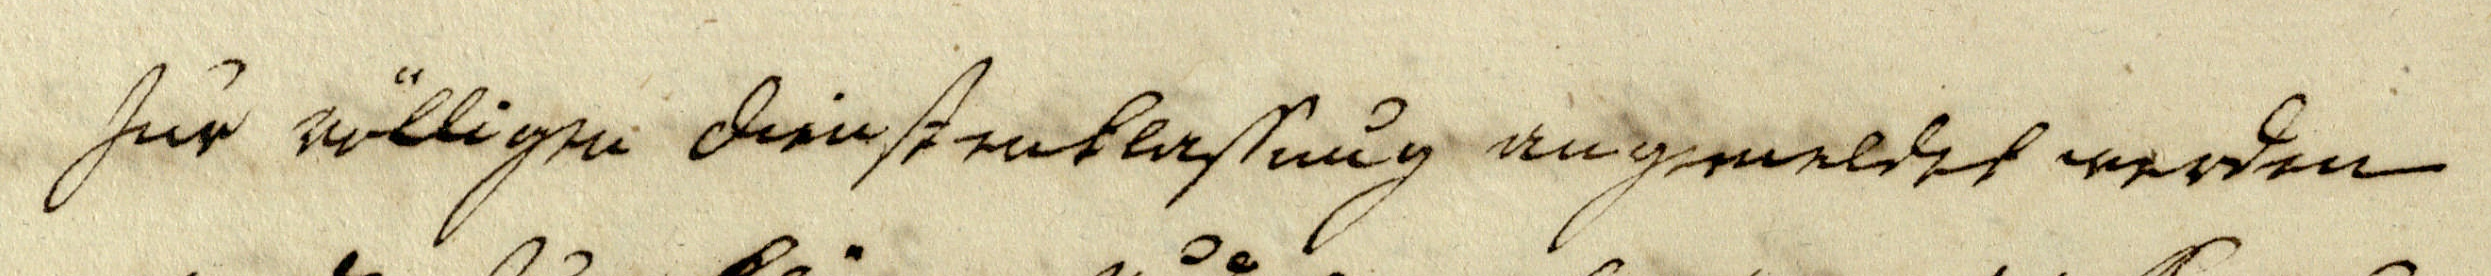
zur völligen Dienstentlassung angemeldet werden
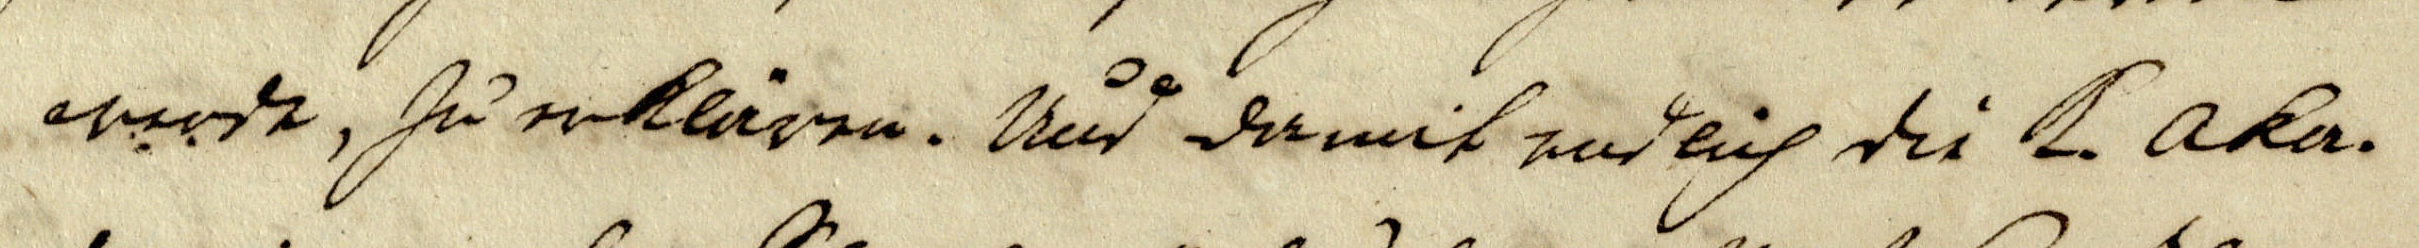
werde, zu erklären. Und damit endlich die K. Aka¬
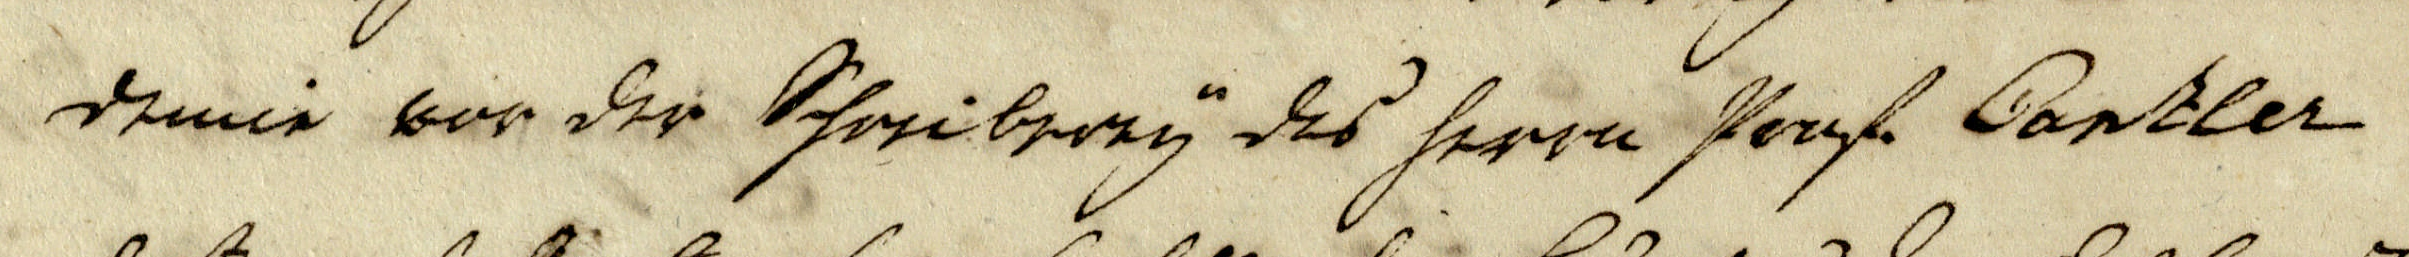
demie vor der Schreibereÿ des Herrn Prof. Canzler
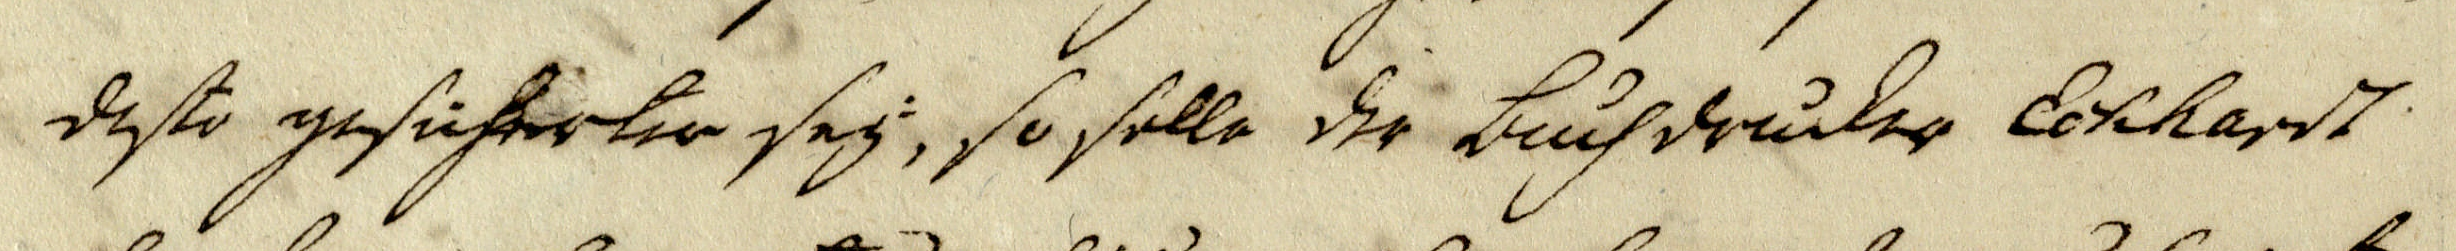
desto gesicherter seÿ, so solle der Buchdrucker Eckhardt
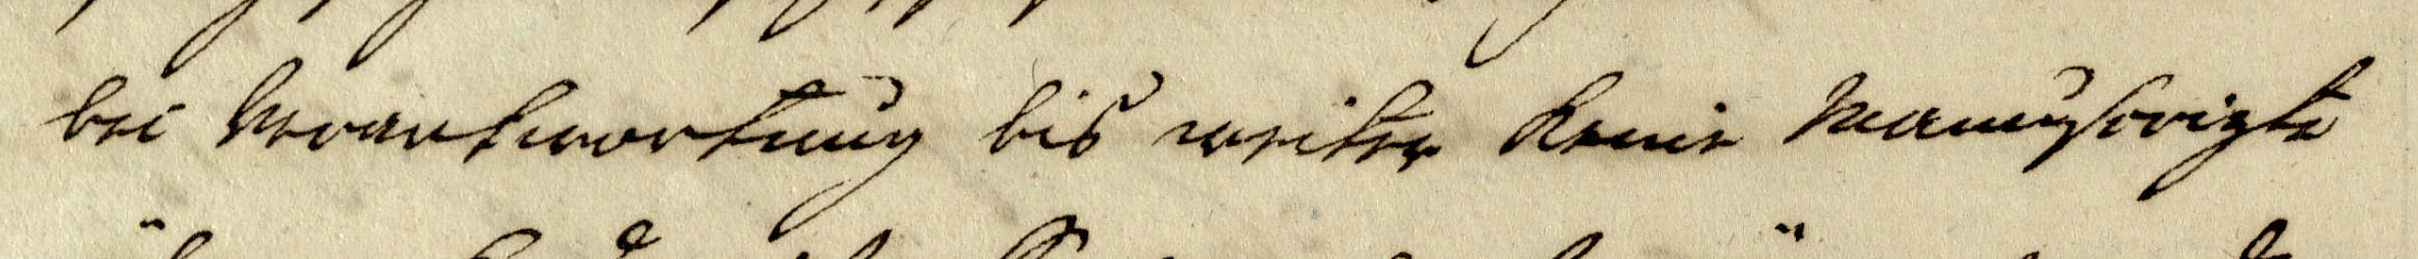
bei Verantwortung bis weiter keine Manuscripte
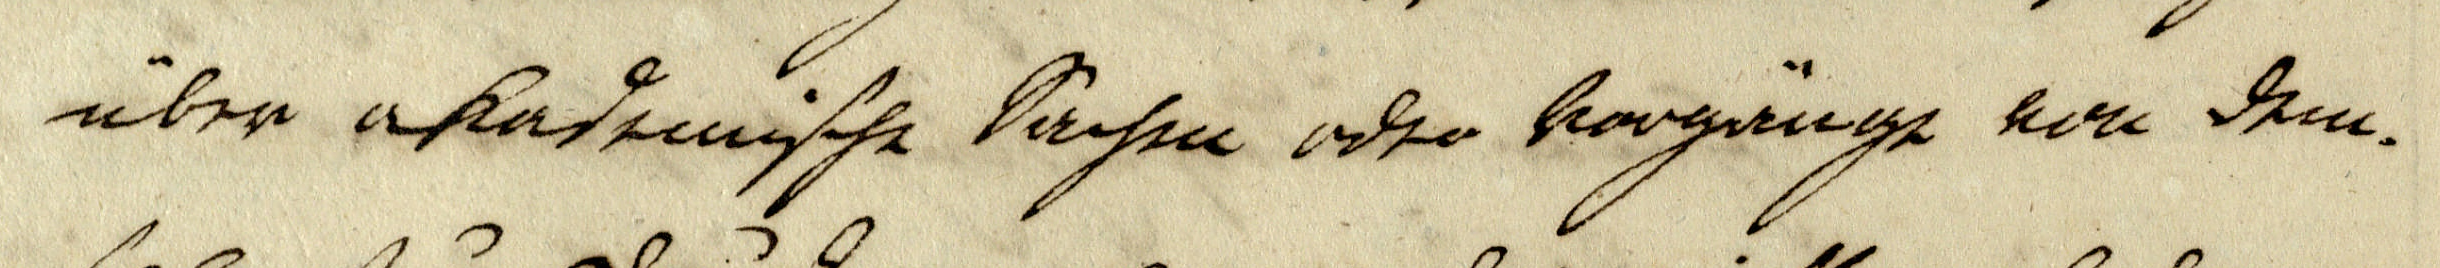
über akademische Sachen oder Vorgänge von dem¬
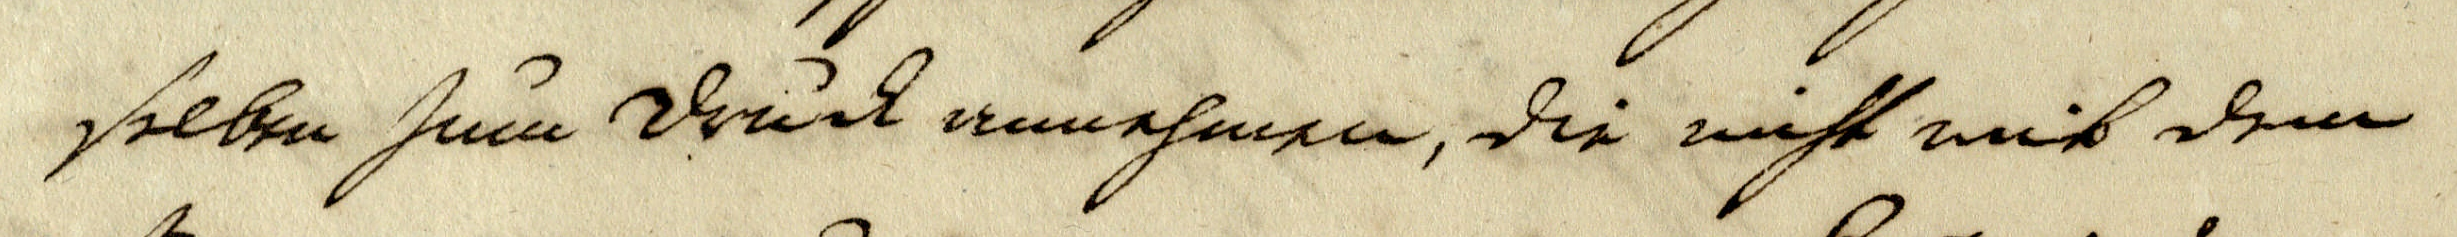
selben zum Druck annehmen, die nicht mit dem
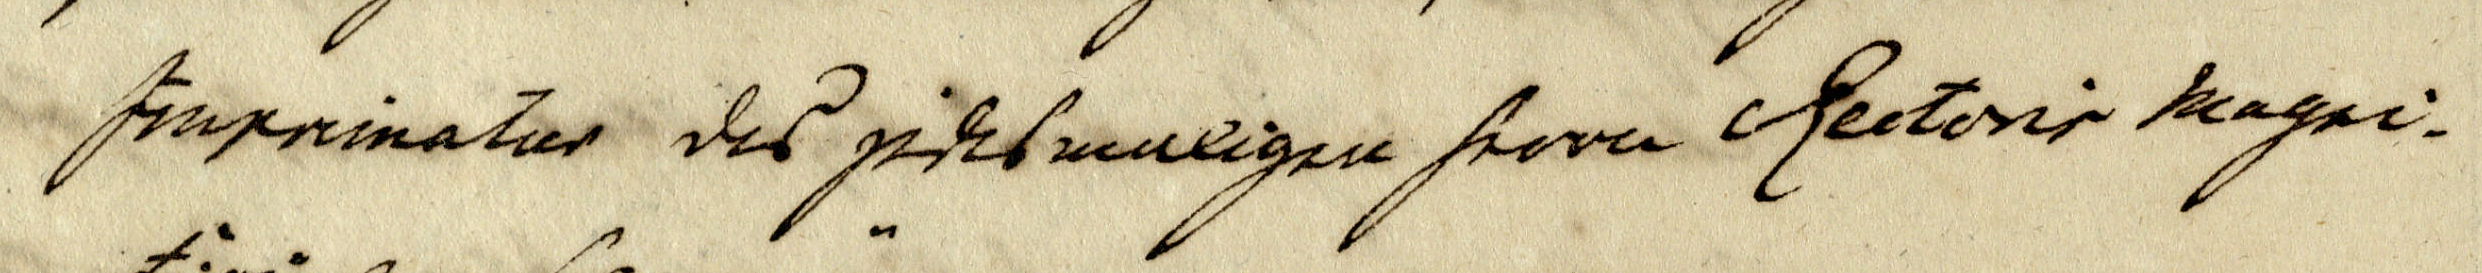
Impninator des jedesmaligen Herrn Rectoris Magni¬
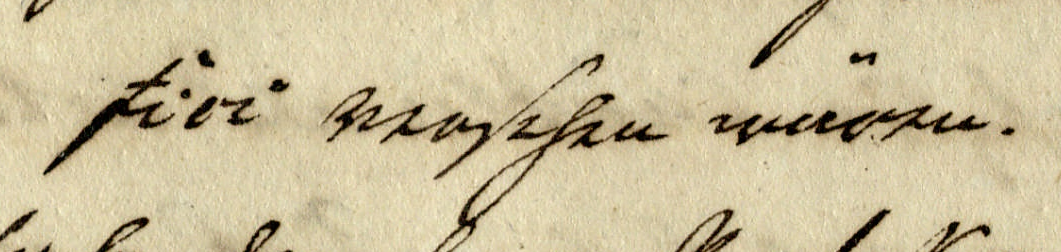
fici versehen wären.
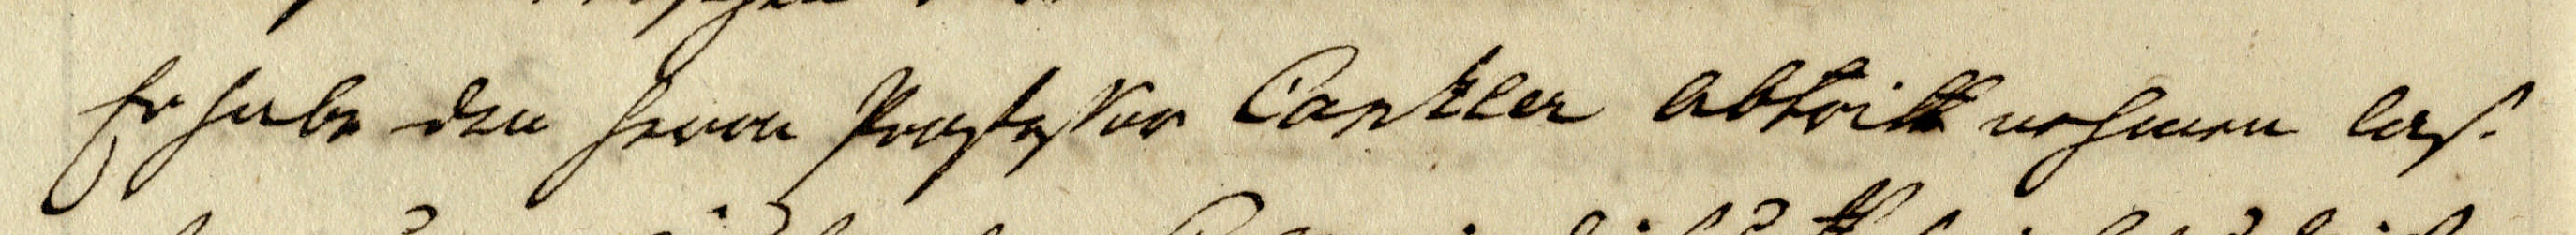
Er habe den Herrn Professor Canzler Abtritt nehmen las¬
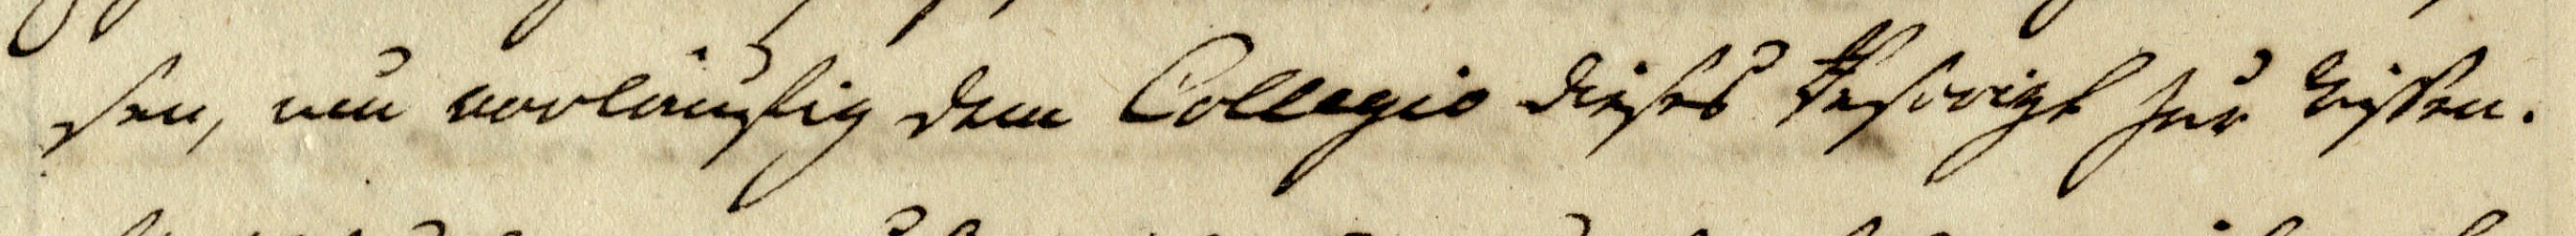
sen, um vorläufig dem Collegio dieses Rescript zur Wissen¬
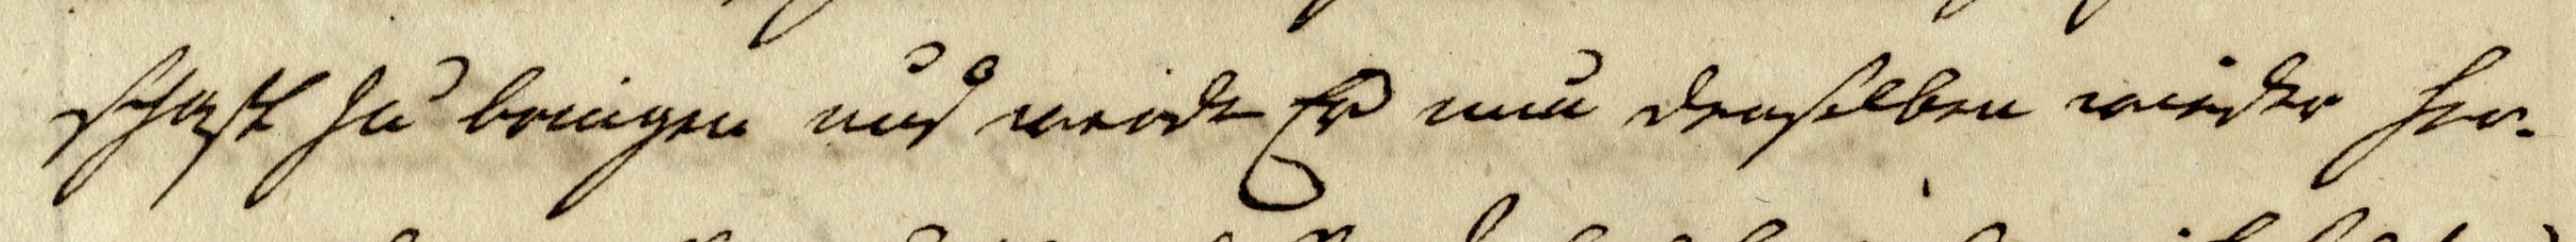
schaft zu bringen und werde Er nun denselben wieder her¬
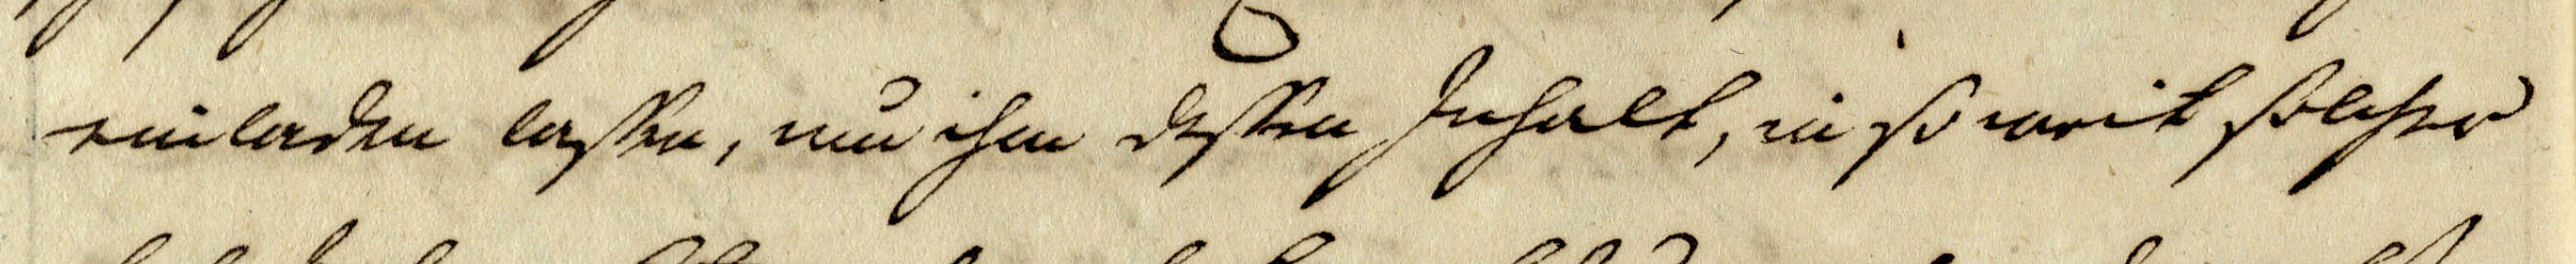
einladen lassen, um ihm dessen Inhalt, in so weit solcher
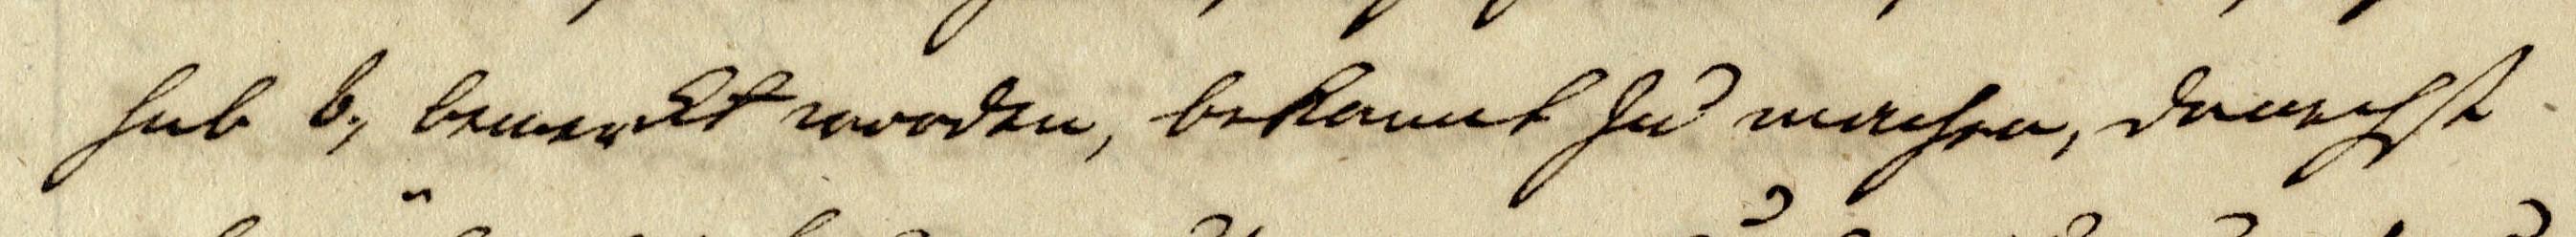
sub b, bemerckt worden, bekannt zu machen, danechst
